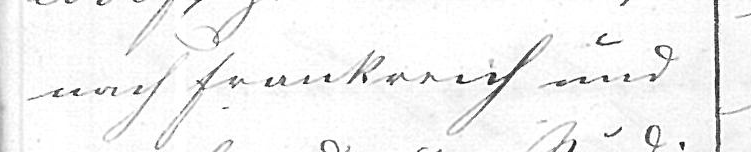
nach Frankreich und
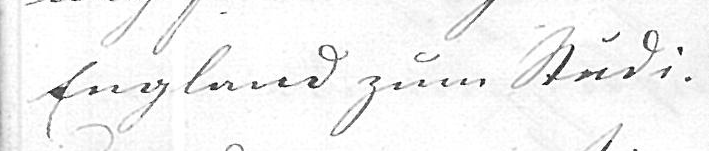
England zum Studi-
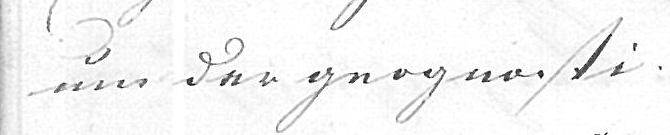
um der geognosti-
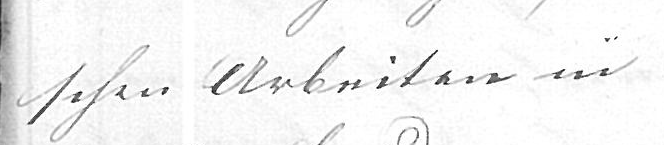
schen Arbeiten in
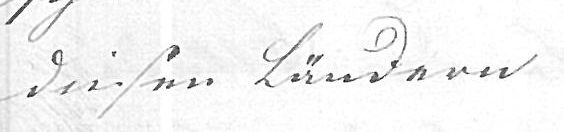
diesen Ländern.
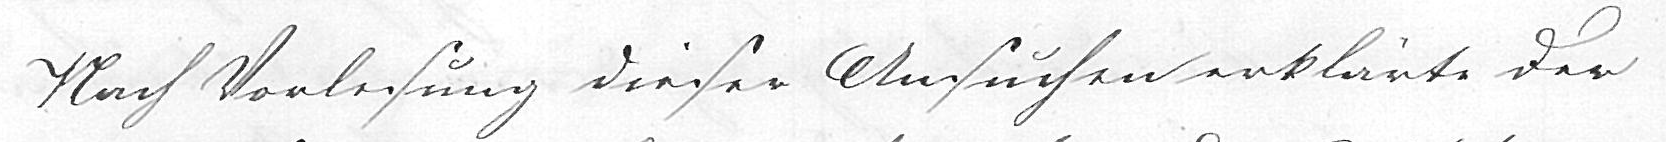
Nach Vorlesung dieser Ansuchen erklärte der
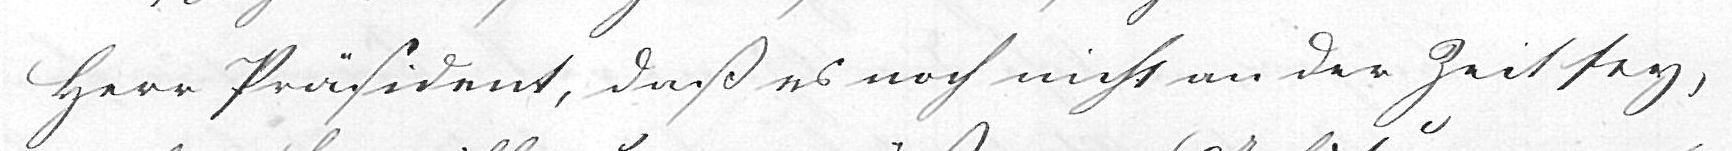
Herr Präsident, daß es noch nicht an der Zeit sey,
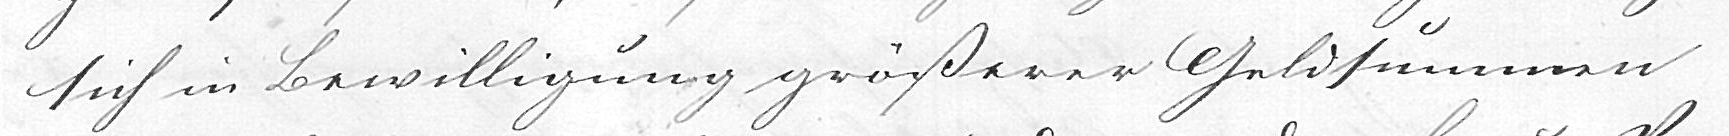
sich in Bewilligung größerer Geldsummen
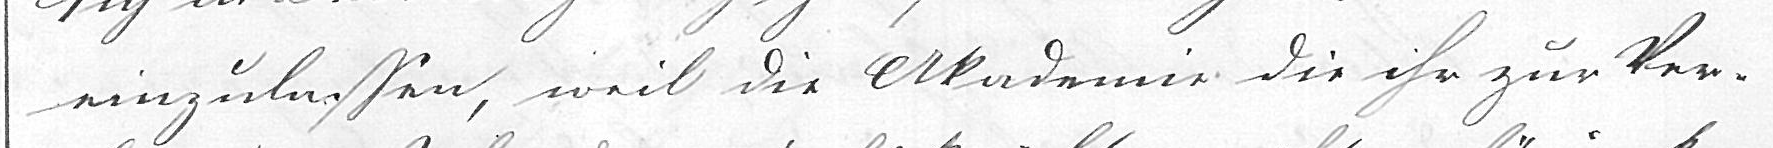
einzulassen, weil die Akademie die ihr zur Ver-
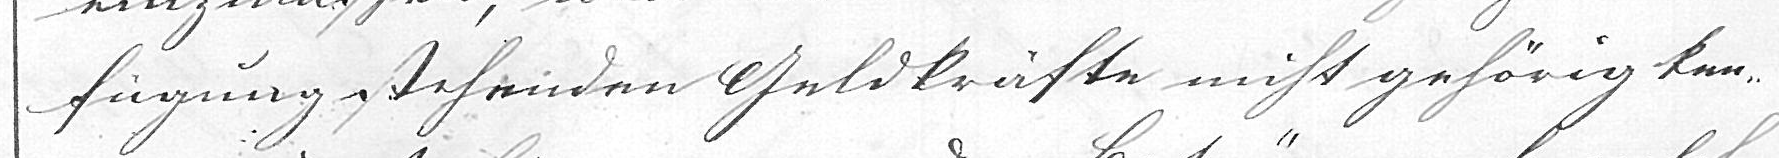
fügung stehenden Geldkräfte nicht gehörig ken-
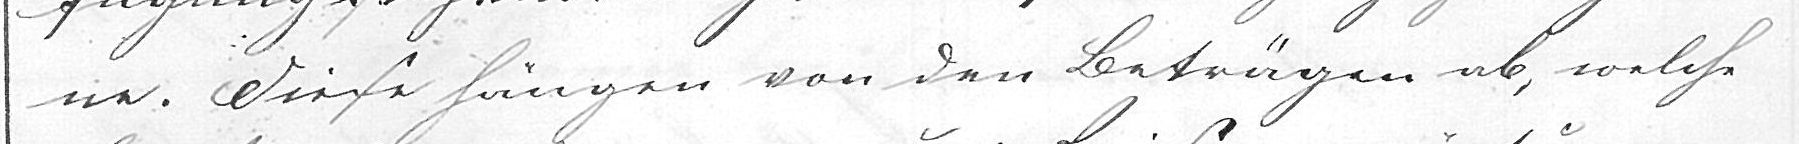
ne. Diese hängen von den Beträgen ab, welche
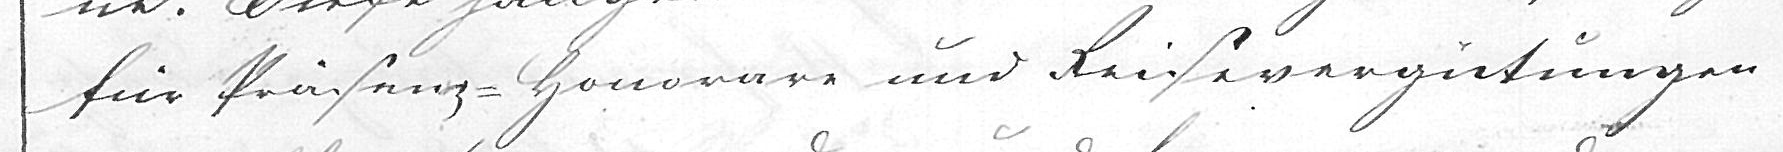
für Präsenz-Honorare und Reisevergütungen
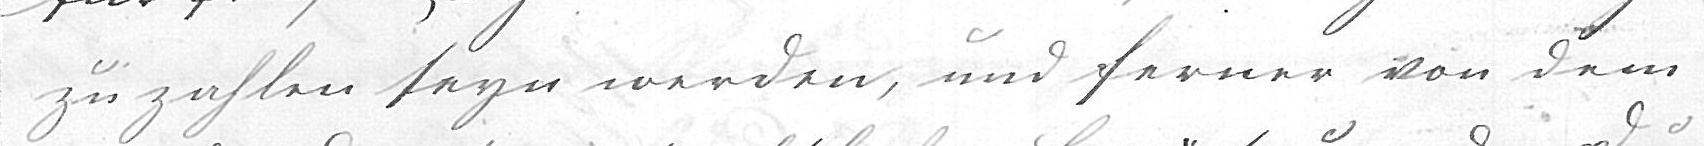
zu zahlen seyn werden, und ferner von dem
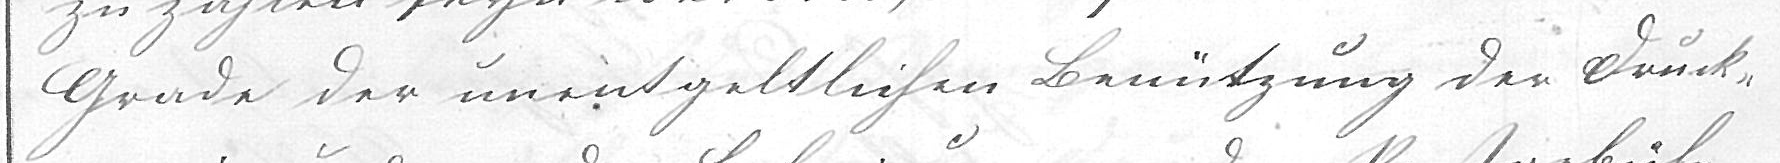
Grade der unentgeltlichen Benützung der Druck-
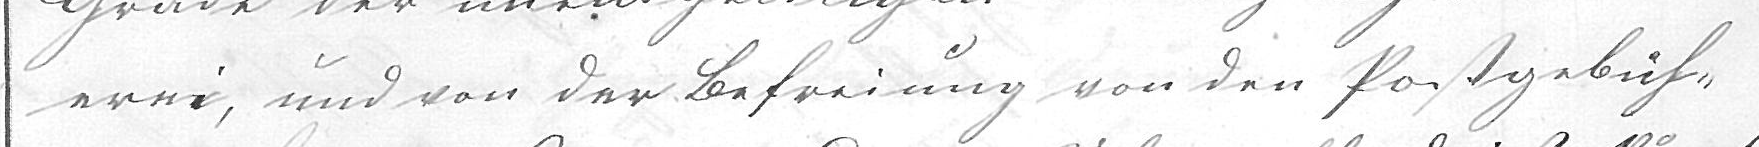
erei, und von der Befreiung von den Postgebüh-
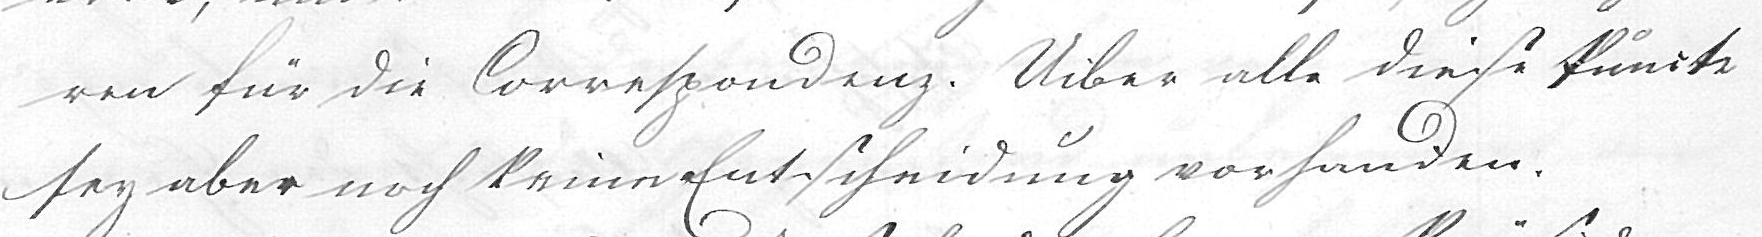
ren für die Correspondenz. Uiber alle diese Puncte
